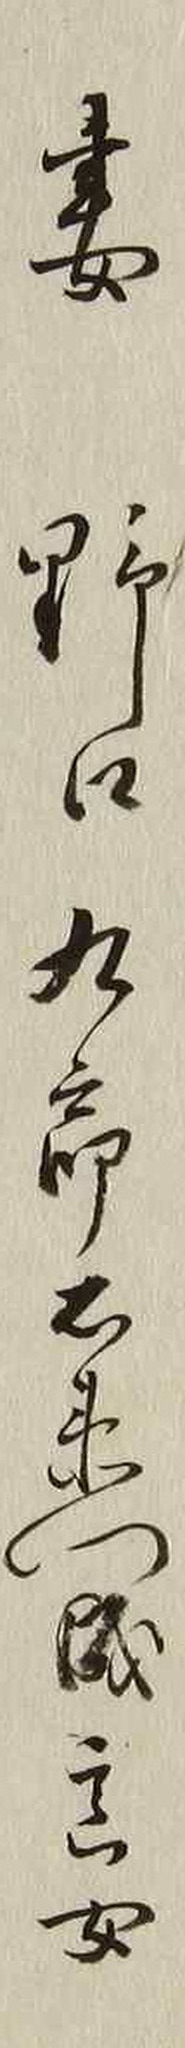妻野口九郎右衛門成意女
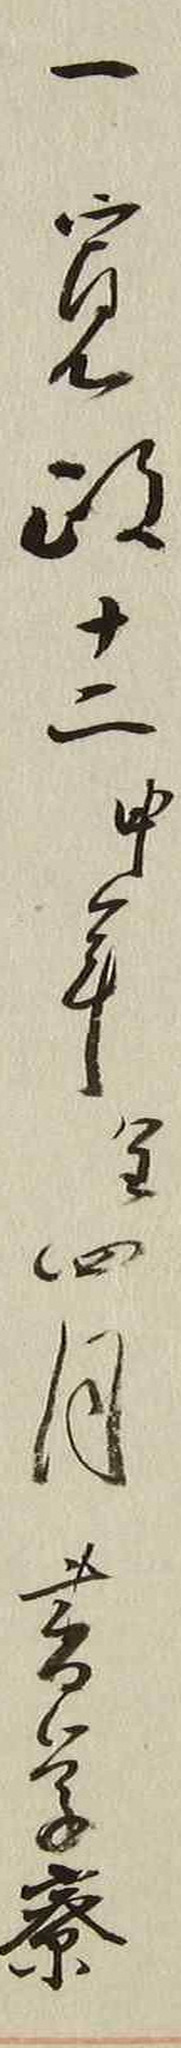一寛政十二申年閏四月三日書学寮
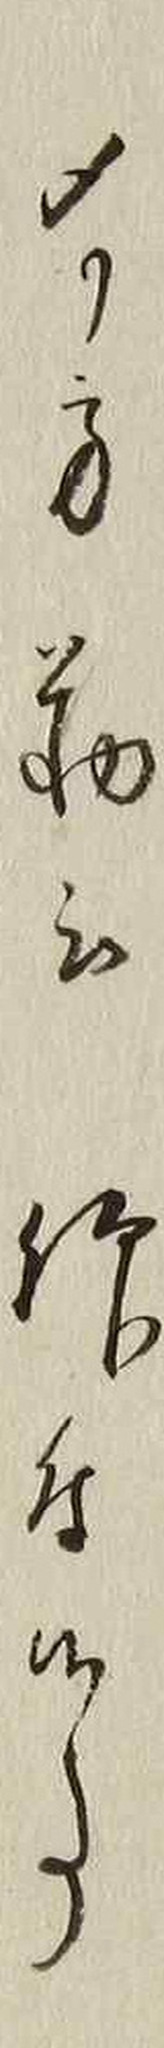〆り方勤被仰付候事
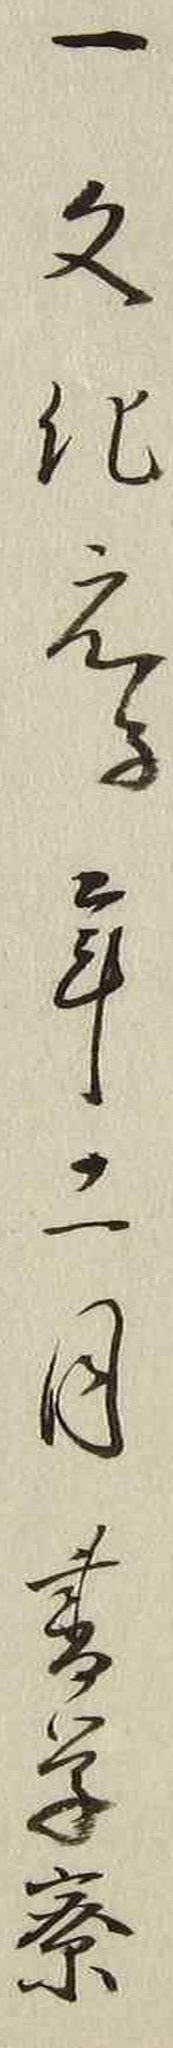一文化元子年十一月書学寮
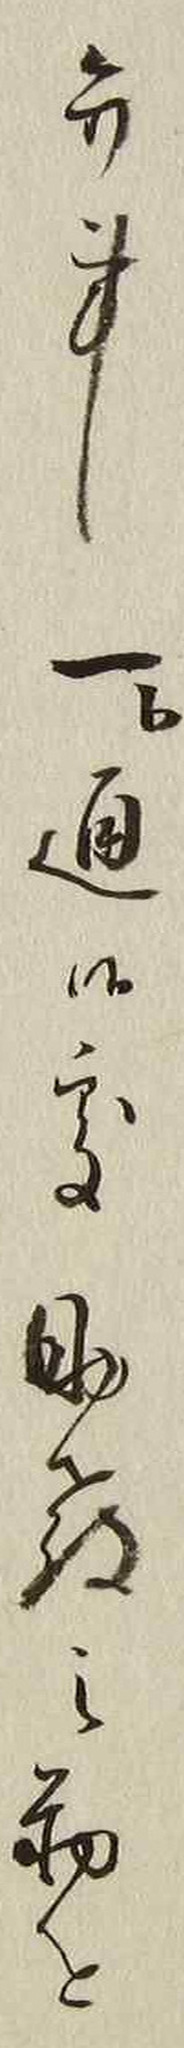弁事一と通候処助役之勤を
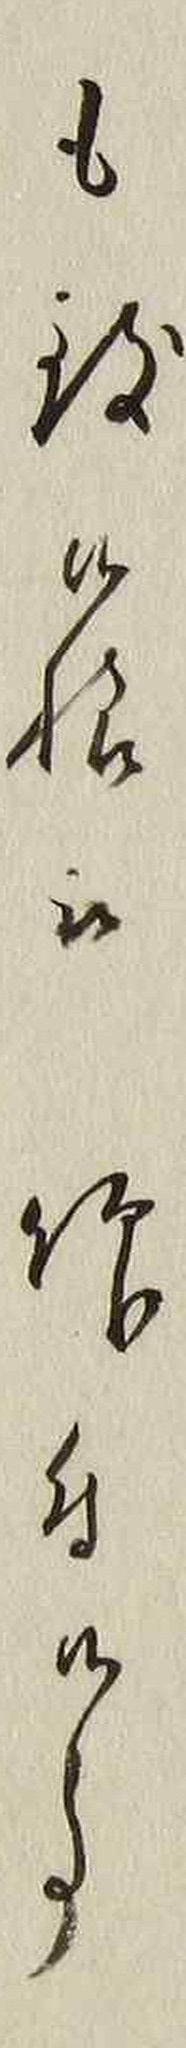も致候様被仰付候事
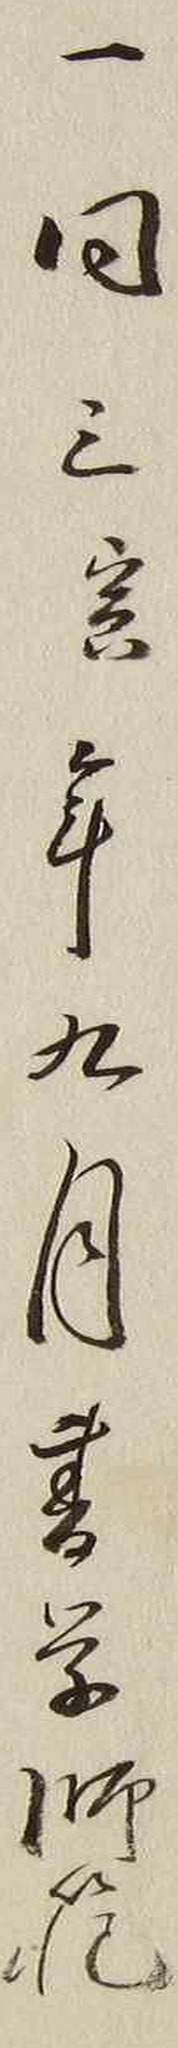一同三寅年九月書学師範
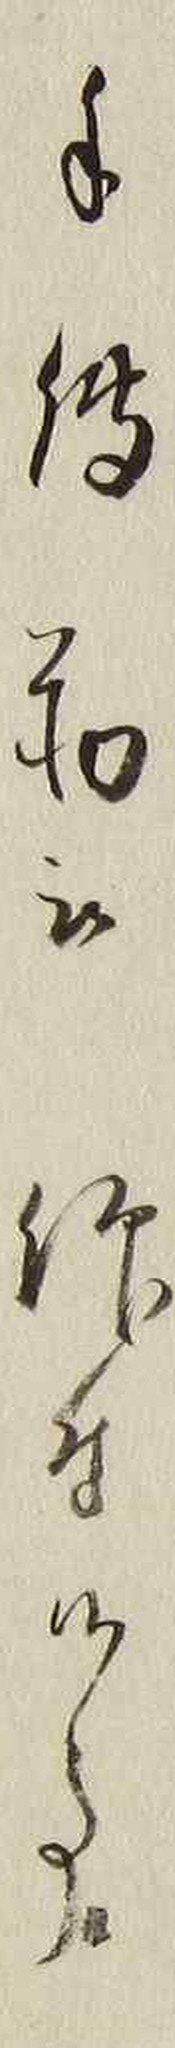手伝勤被仰付候事
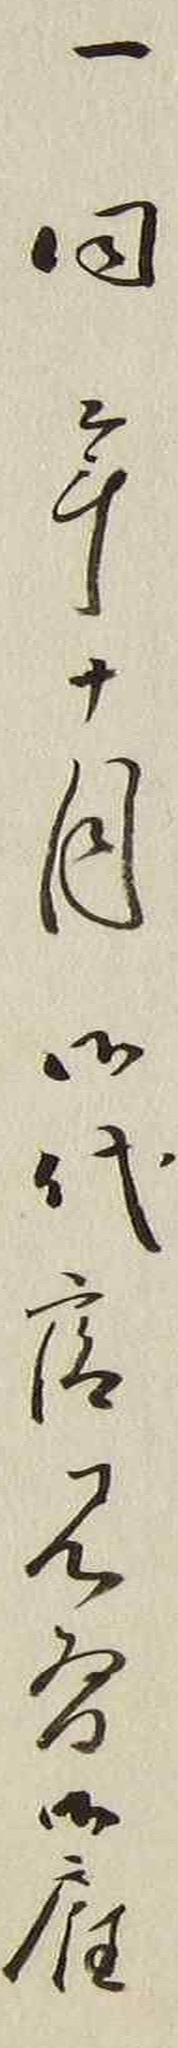一同年十月御代官見習御雇
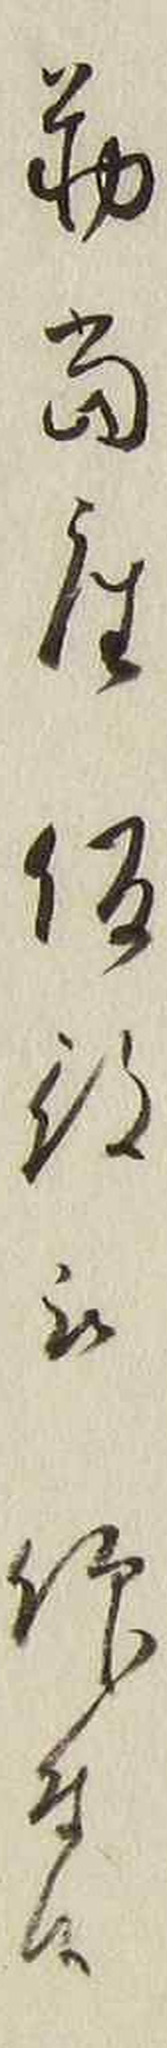勤当座仮役被仰付候
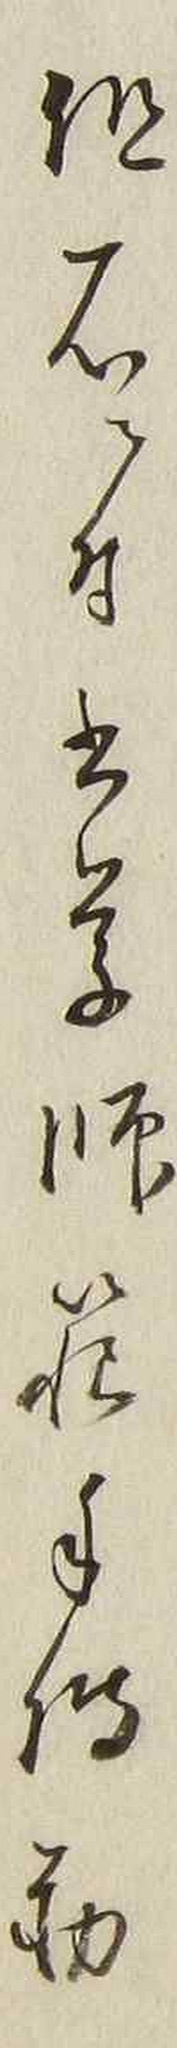但右に付書学師範手伝勤

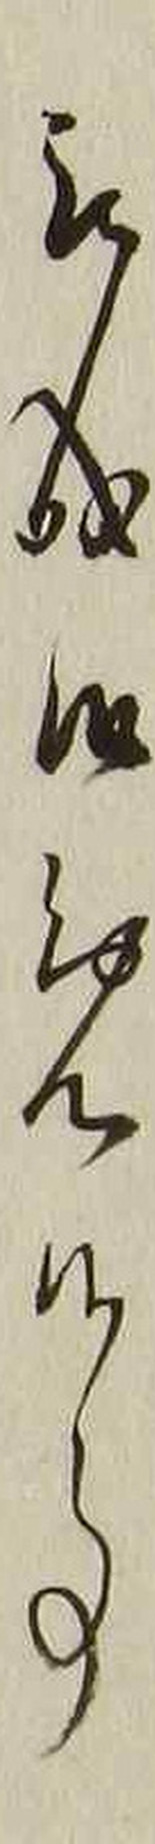被成御免候事
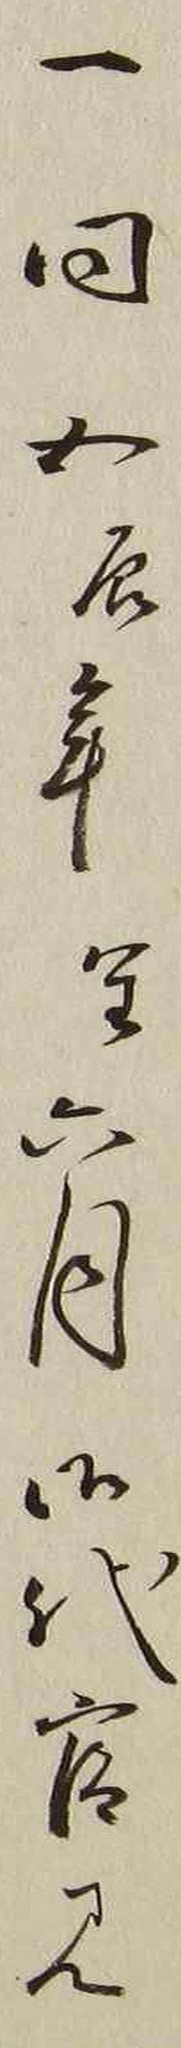一同五辰年閏六月御代官見
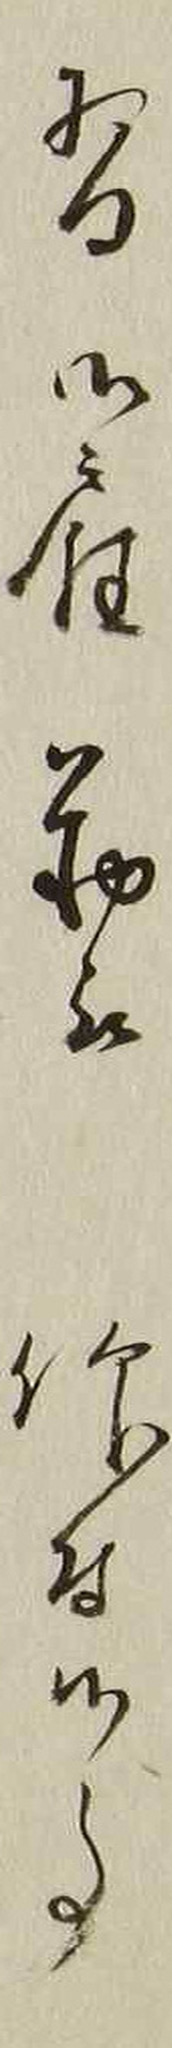習御雇勤被仰付候事
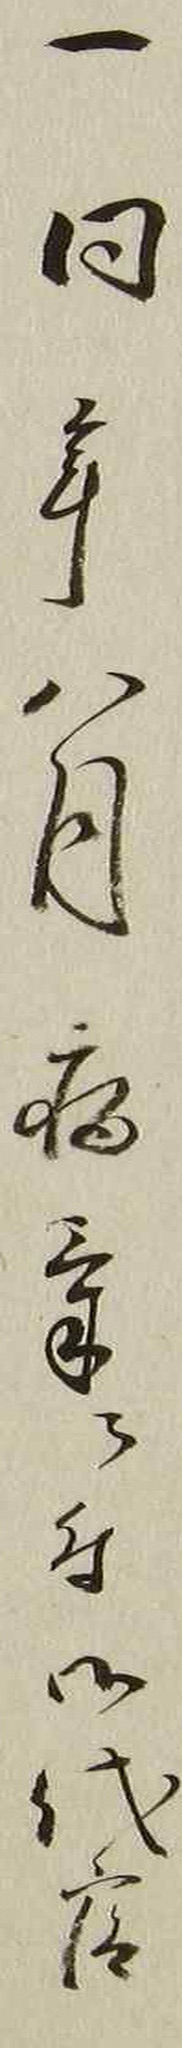一同年八月病気に付御代官
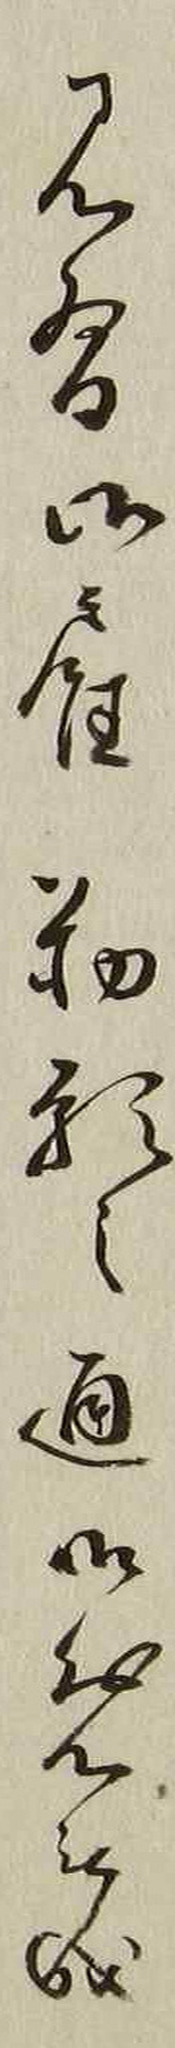見習御雇勤願之通御免被成
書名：諸士系譜　巻之159　な之部1
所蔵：会津若松市立会津図書館
